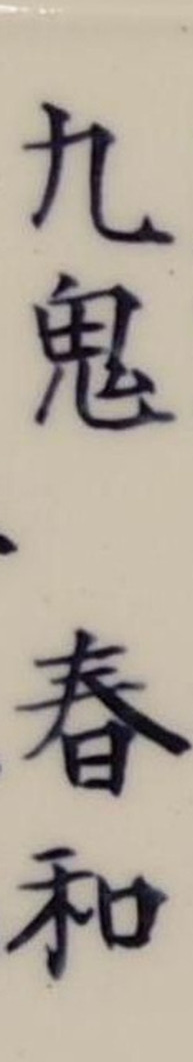九鬼春和
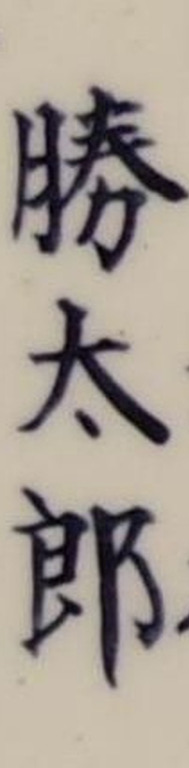勝太郎
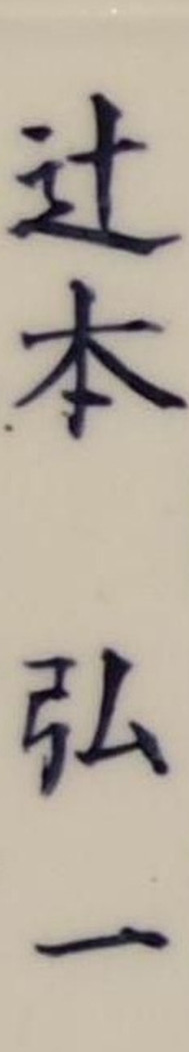辻本弘一
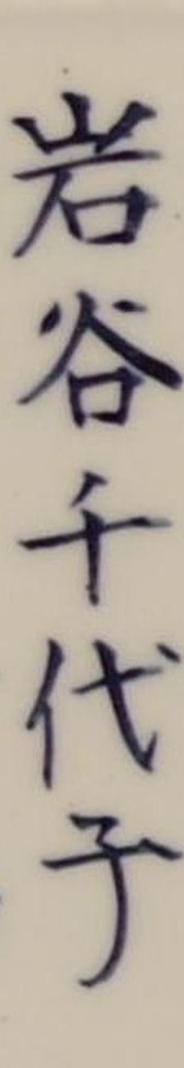岩谷千代子
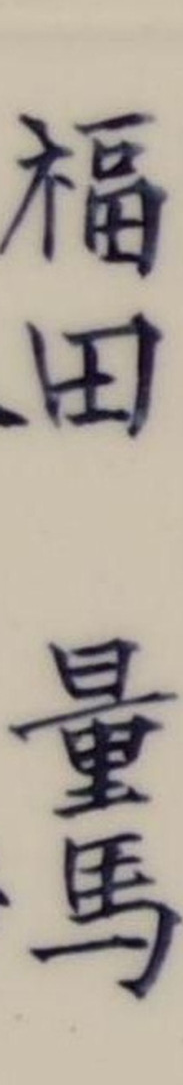福田量馬
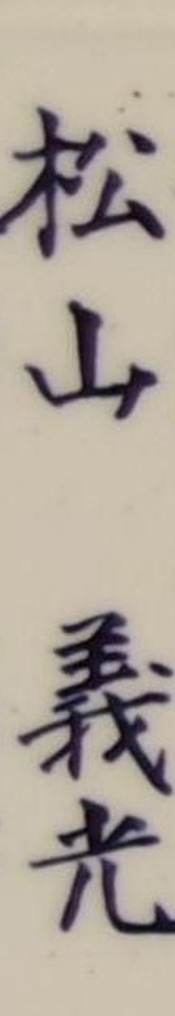松山義光
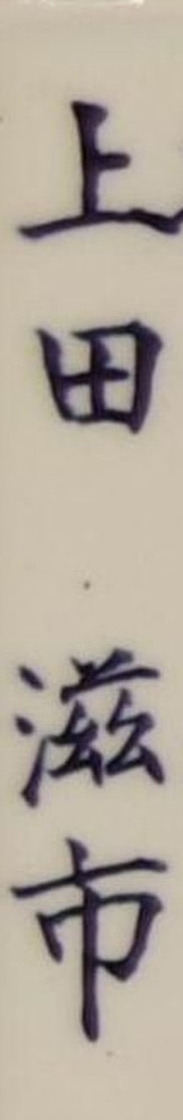上田滋市

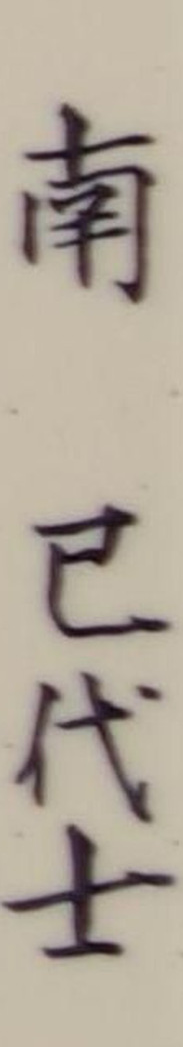南巳代士
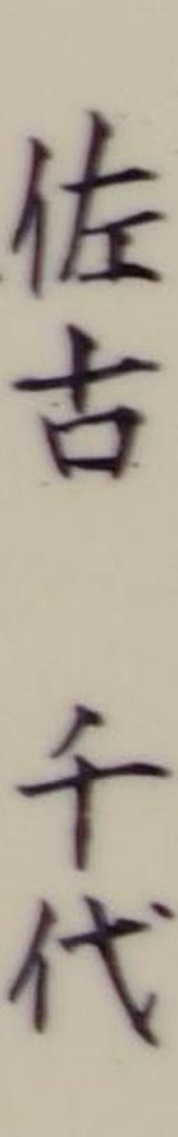佐古千代
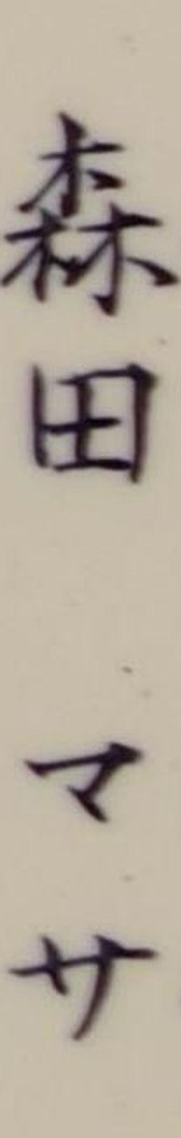森田マサ
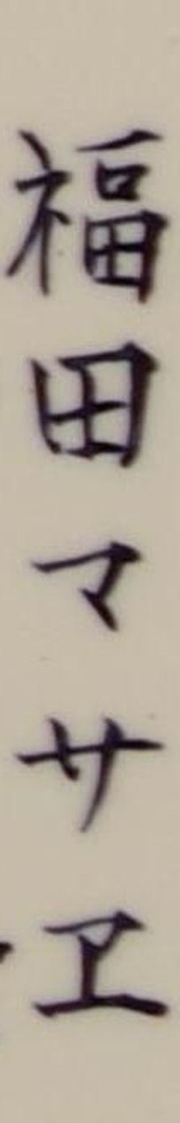福田マサヱ
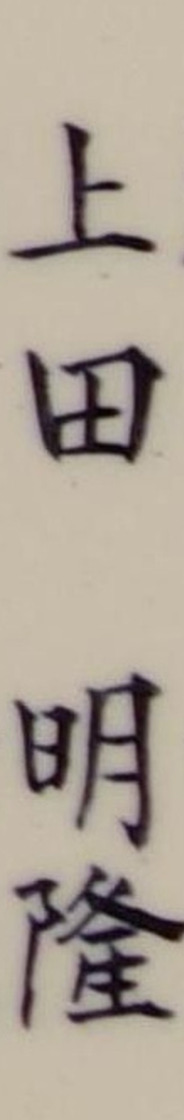上田明隆
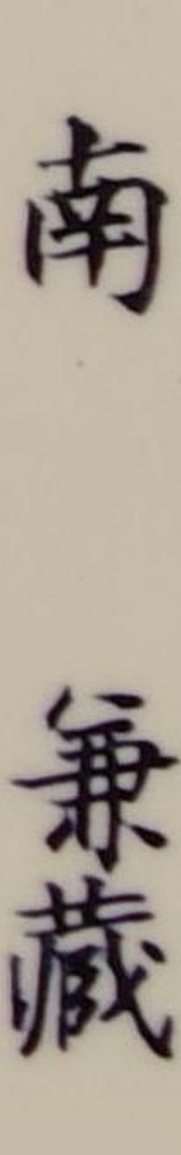南兼蔵
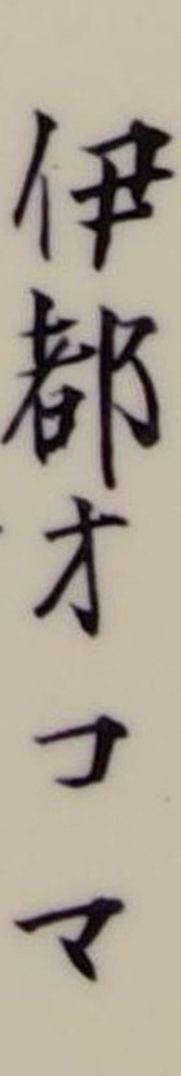伊都オコマ
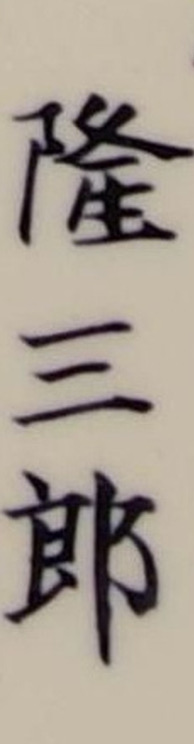隆三郎
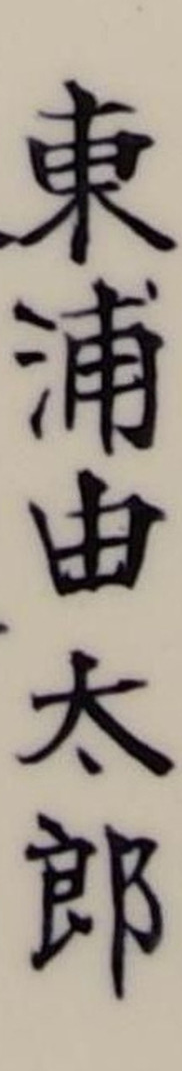東浦由太郎
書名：E~L
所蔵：高野山金剛峯寺
